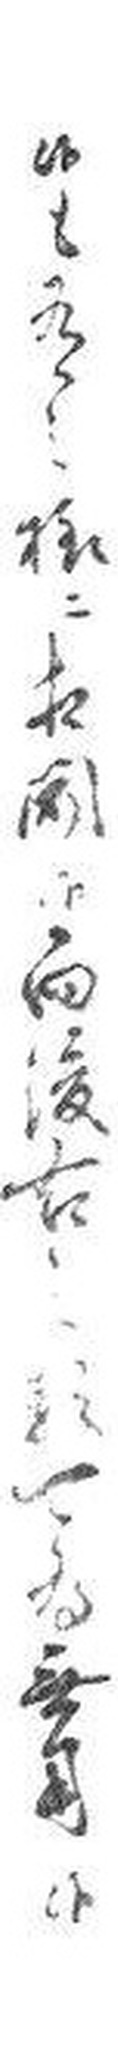候も有之様ニ相聞候向後右之類可為無用候
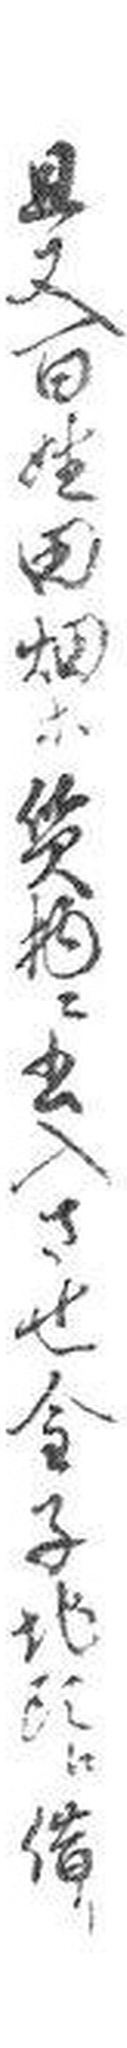且又百姓田畑等質物ニ書入させ金子地頭江借り
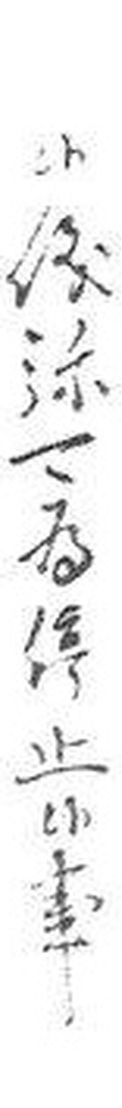候儀弥可為停止候事
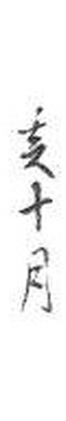亥十月
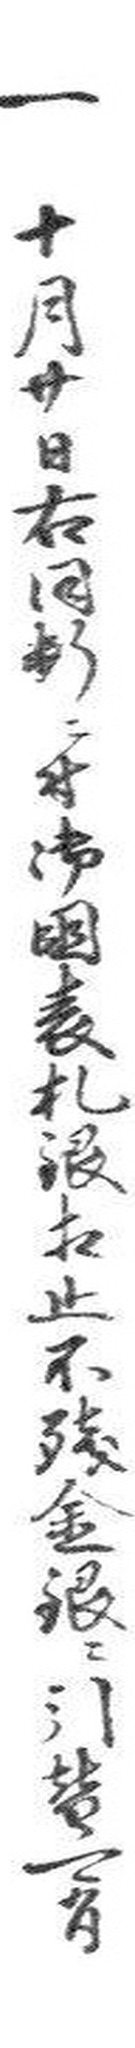一十月廿日右同断ニ付御国表札銀相止不残金銀ニ引替可有
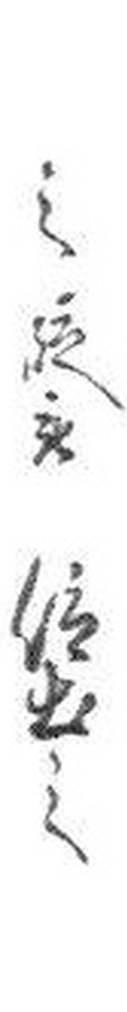之段被仰出之
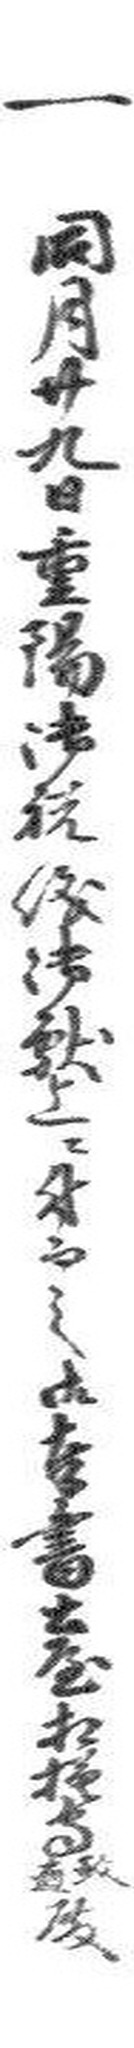一同月廿九日重陽御祝儀御献上ニ付而之御奉書土屋相模守政直殿
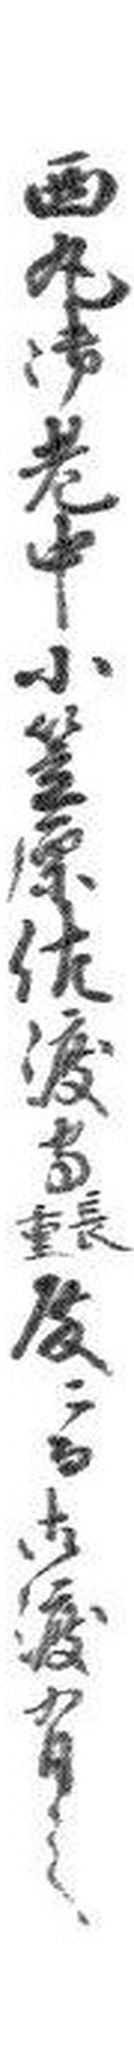西丸御老中小笠原佐渡守長重殿ニ而御渡有之
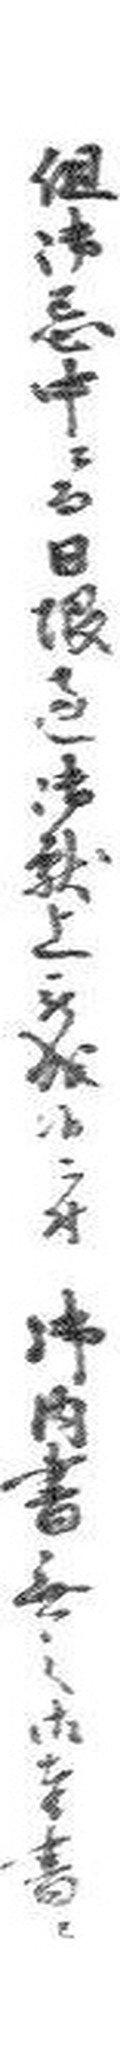但御忌中ニ而日限過御献上被成候ニ付御内書無之御奉書
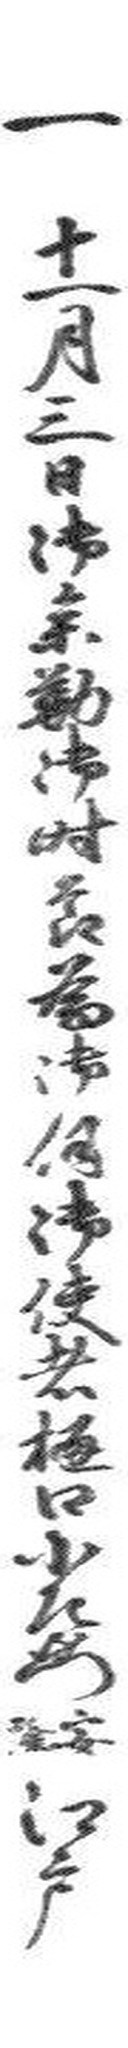一十一月三日御参勤御時節為御伺御使者樋口小左衛門安隆江戸
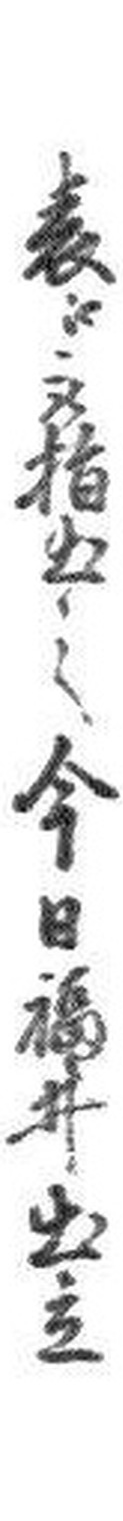表江被指出之今日福井出立
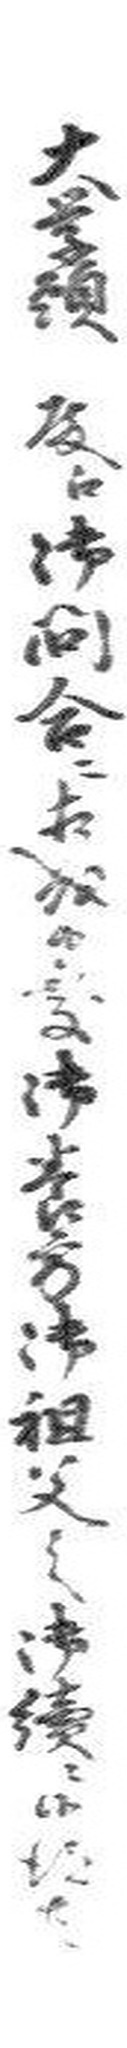大学頭殿江御問合ニ相成候処御養方御祖父之御続ニ候得共

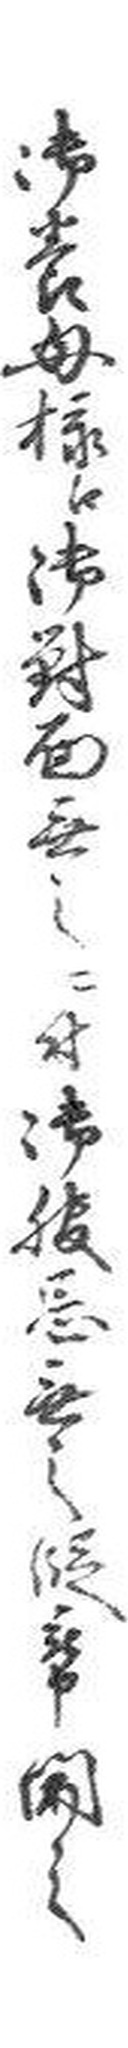御養母様江御対面無之ニ付御服忌無之段被申聞之
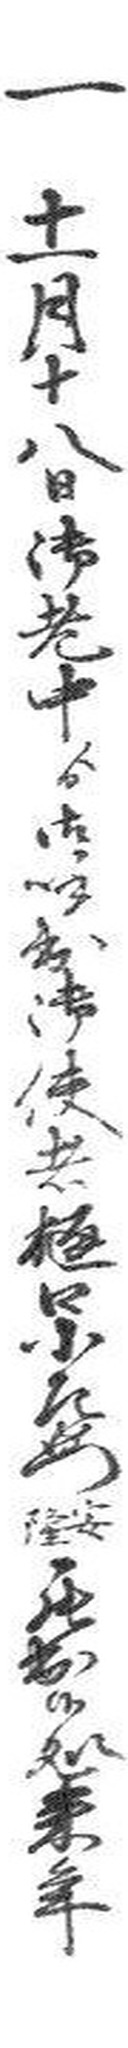一十一月十八日御老中ゟ御呼出御使者樋口小左衛門安隆罷出候処来年
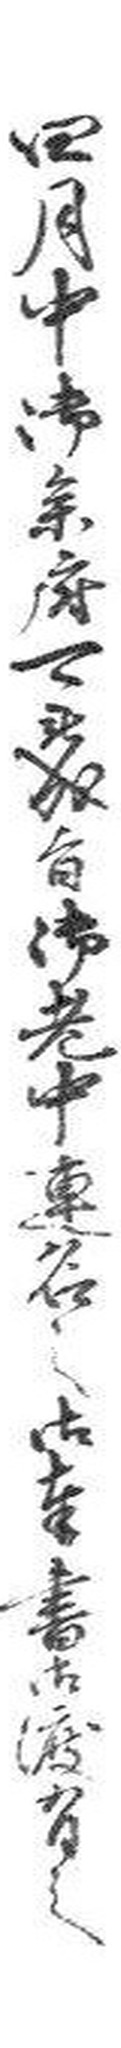四月中御参府可被成旨御老中連名之御奉書御渡有之
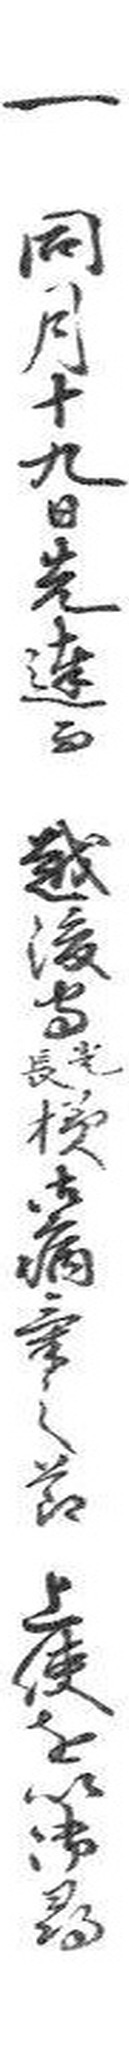一同月十九日先達而越後守光長様御病気之節上使を以御尋
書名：家譜 二十四 吉品公 従宝永三年到同五年
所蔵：福井県文書館 Fukui Prefectural Archives
